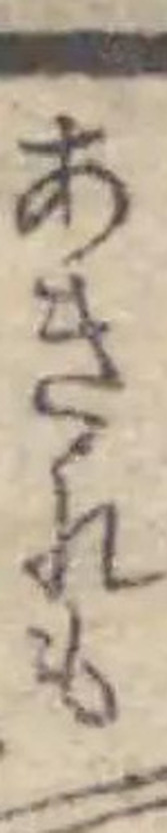あきれも
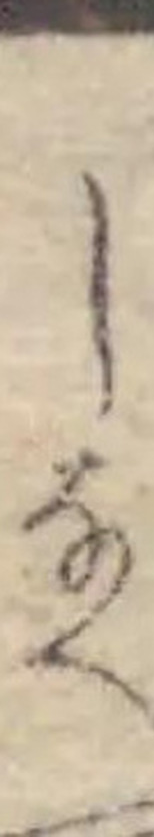しなへ

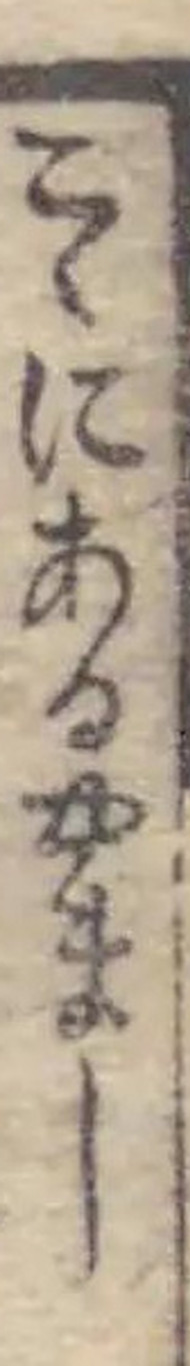こゝにあるやまし
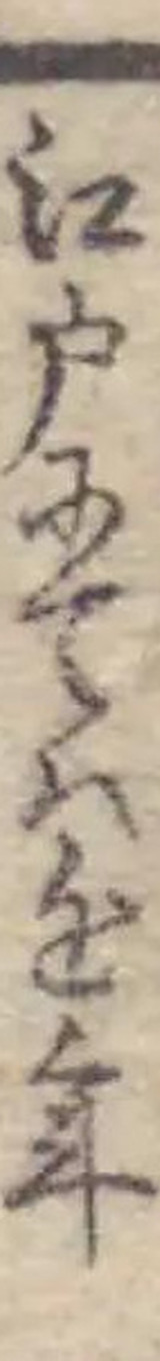江戸にては近年
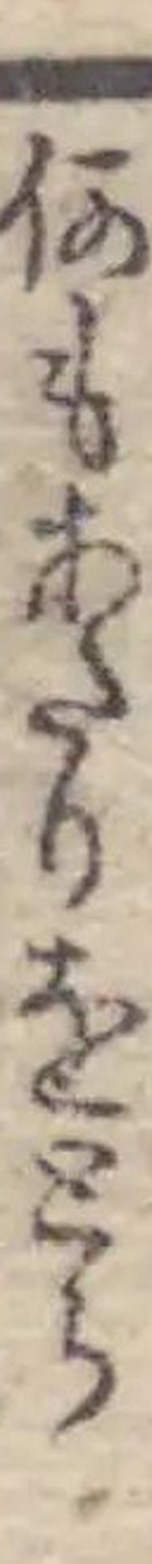何もあたりをとら
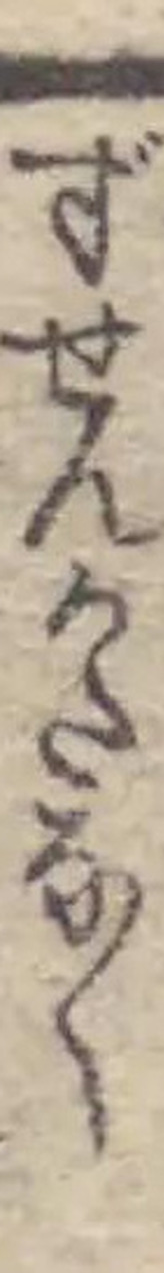ずせんかたなく
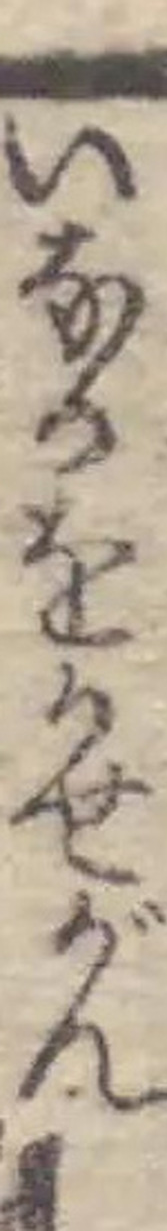いなかをかせがん
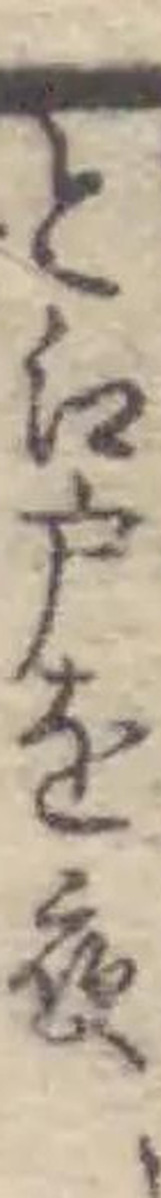と江戸を夜
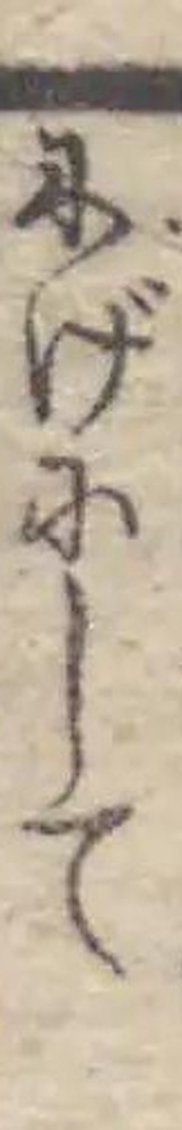にげにして
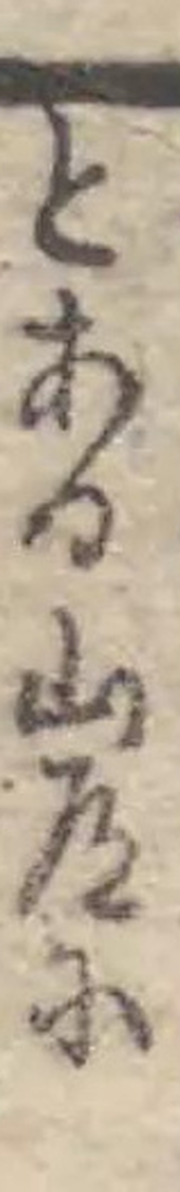とある山道に
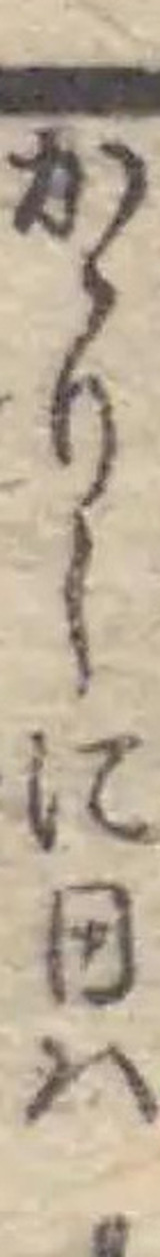かゝりしに日は
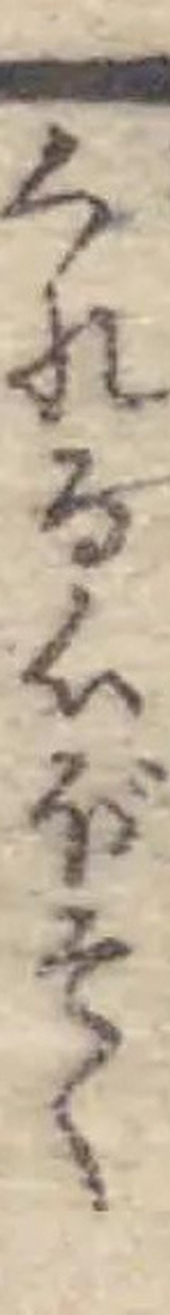くれる心ぼそく
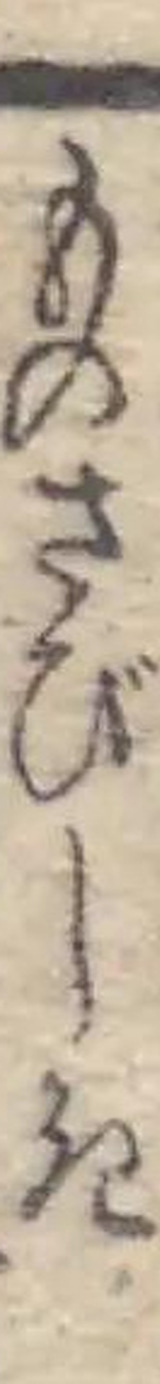ものさびしき
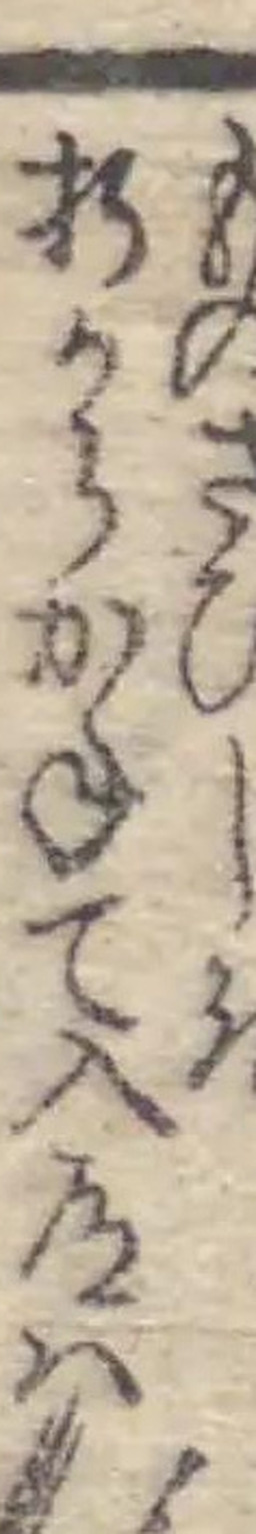折からかねて入道は
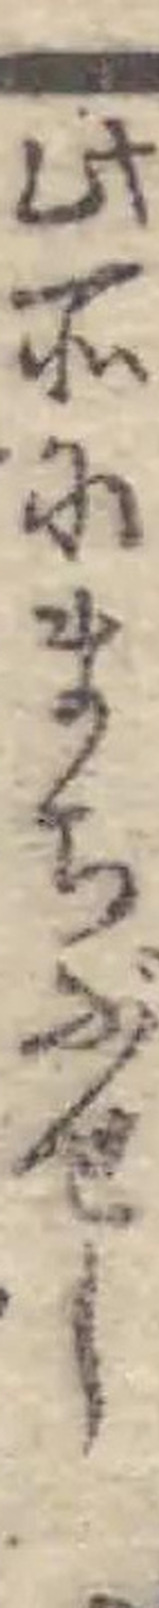此所にまちぶせし
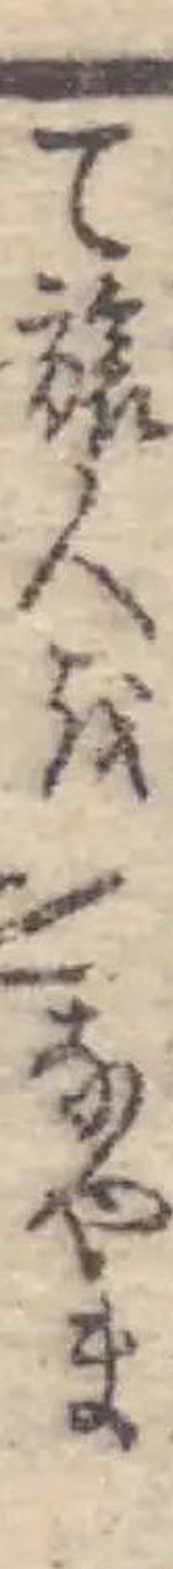て旅人をなやま
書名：作意妖恐懼感心 2巻
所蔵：国立国会図書館 National Diet Library, JAPAN
